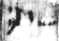九
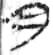月
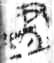○（建）
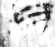於
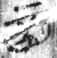梄（酉）
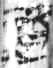○（陷）
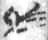於
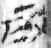戌
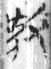○（破）
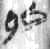於
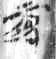亥
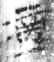坪（平）
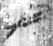於
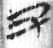子
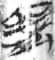寍（寧）
